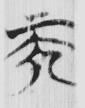而
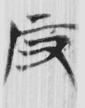反
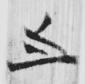之
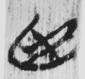臣
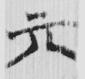亓
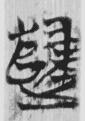歸
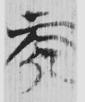而
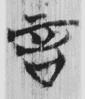言
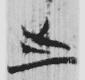之
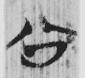公
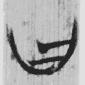曰
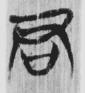君
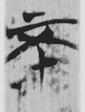不
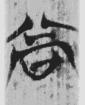尚
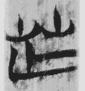芒
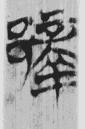{鬲阝}
